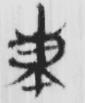東
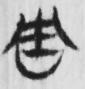周
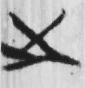之
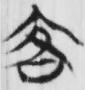客
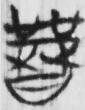○（許）
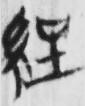○（盈）
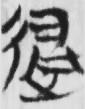歸
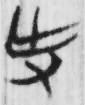乍（胙）
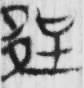郢
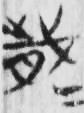歲
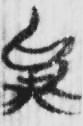○（爨）
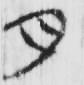月
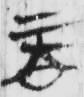丙
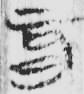晨
